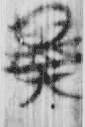異
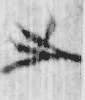之
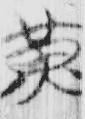黃
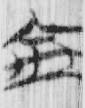金
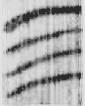四
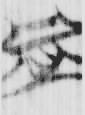益
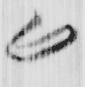㠯（以）
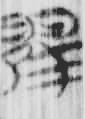翟（糴）
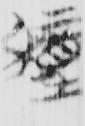穜（種）
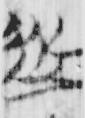迄
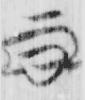○（期）
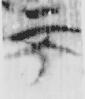不
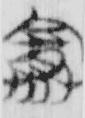賽
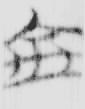金
